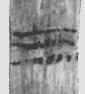三
